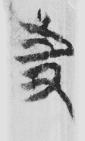寺
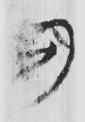名
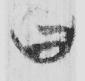曰
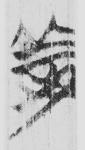義
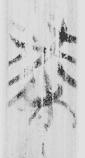楑
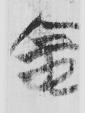{宀𠁩}
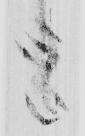水
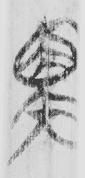{角大}
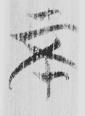不
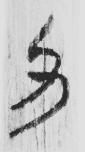力
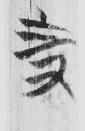寺
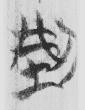型
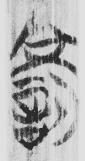罰
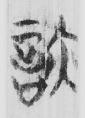{言亦}
